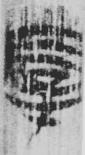厚
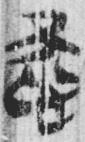愛
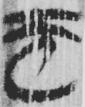而
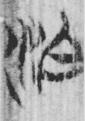泊（薄）
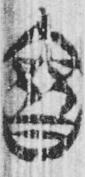噞（斂）
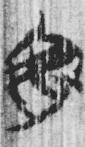安（焉）
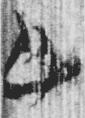身
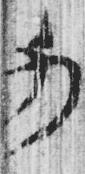力
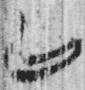㠯（以）
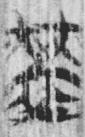○（勞）
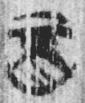百
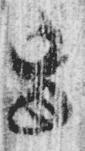眚（姓）
